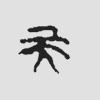天
